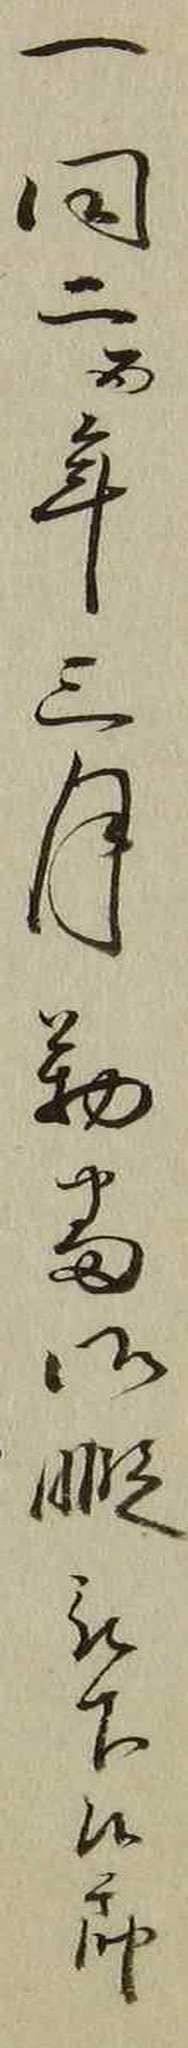一同二酉年三月勤番御暇被下候節
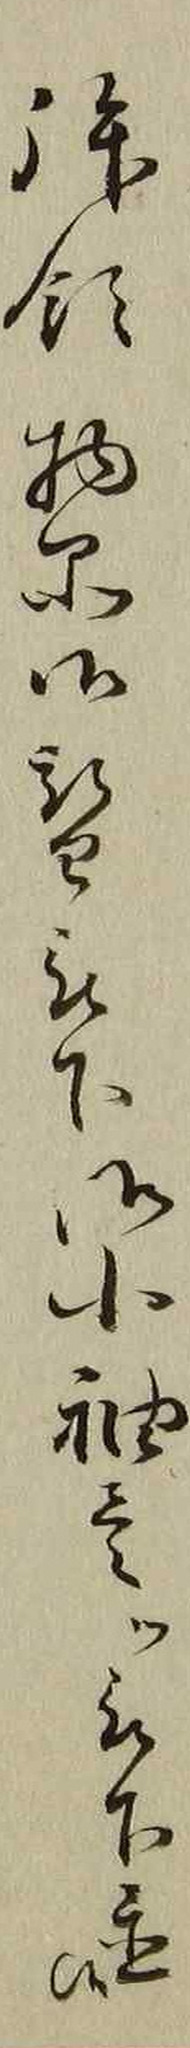拝領物品御替被下御小袖壱ツ被下置候
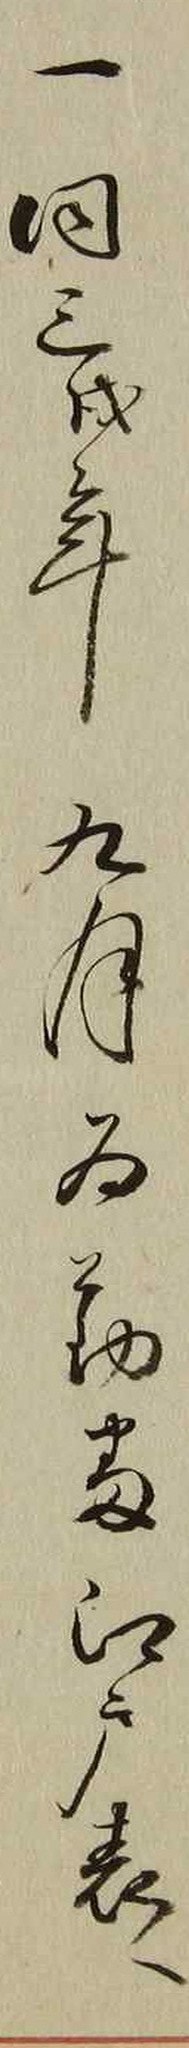一同三戌年九月為勤番江戸表へ
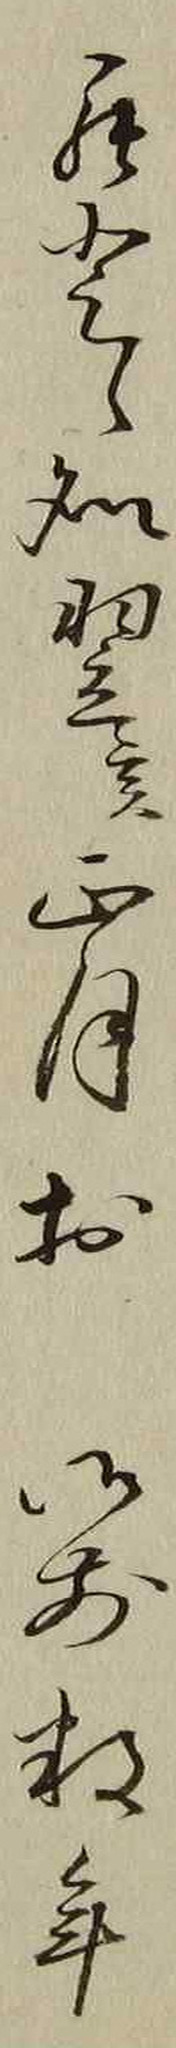罷登候処翌亥正月於御前数年
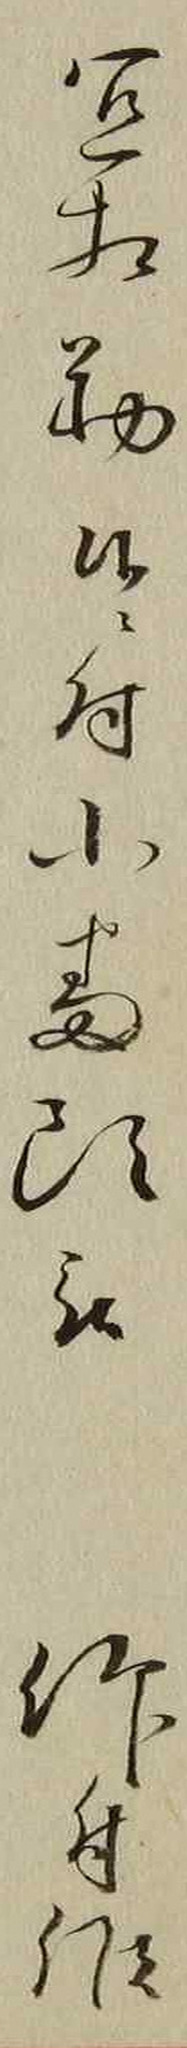宜相勤候ニ付小番頭被仰付候
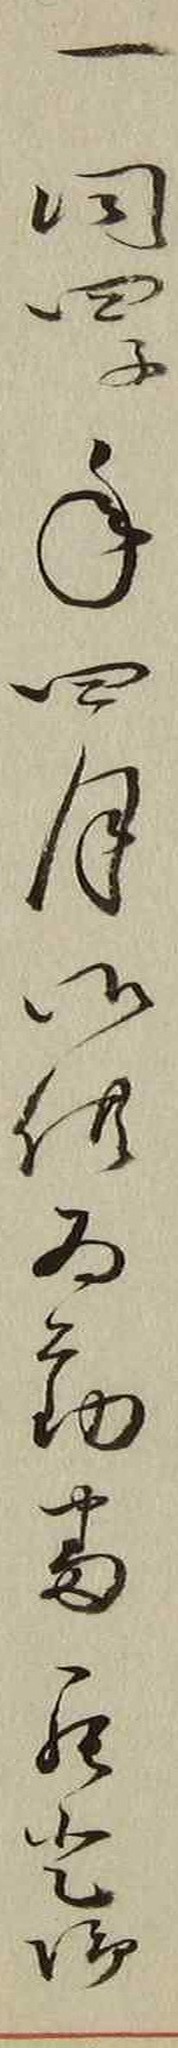一同四子年四月御供為勤番罷登御
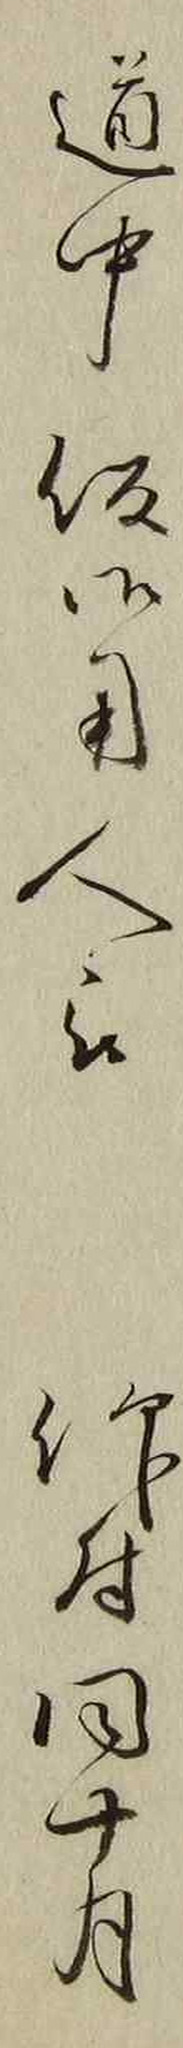道中仮御用人被仰付同十月
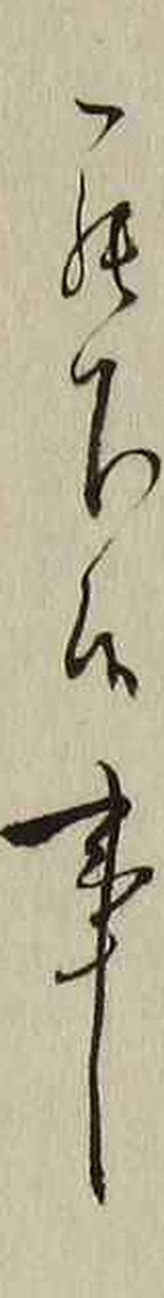罷下候事
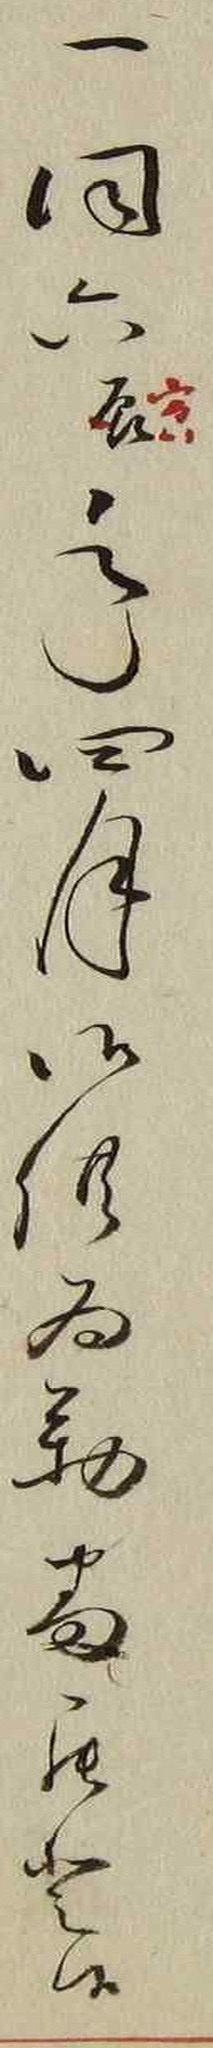一同四子年四月御供為勤番罷登御
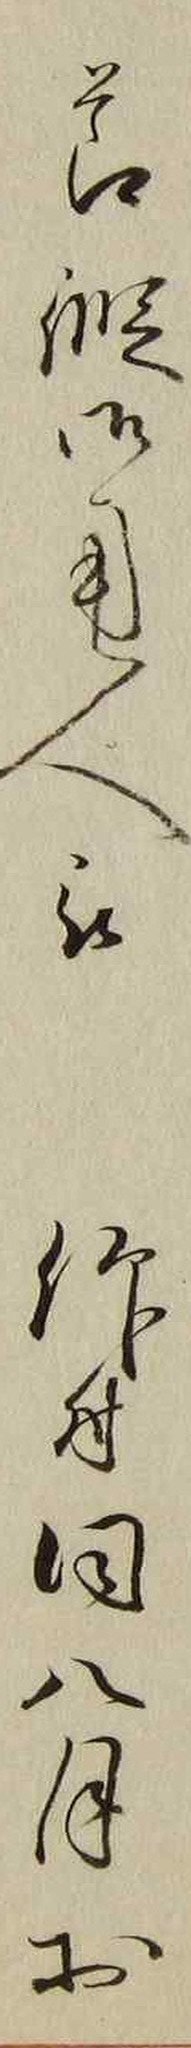節假御用人被仰付同八月於
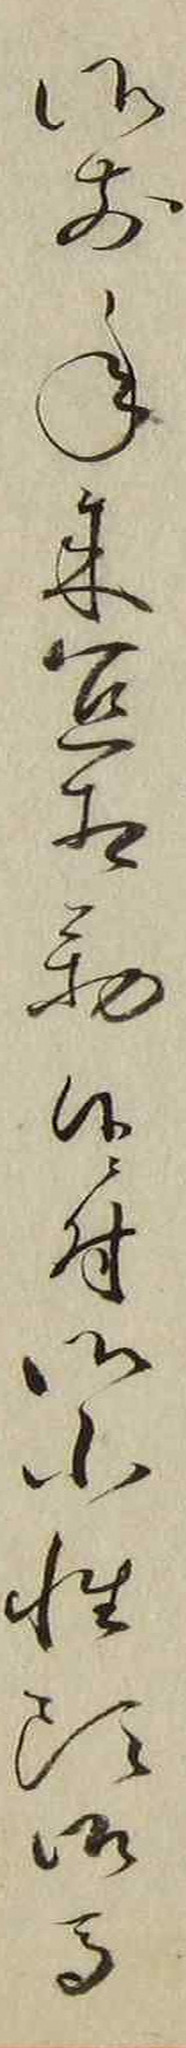御前年来宜相勤候ニ付御小性頭御馬
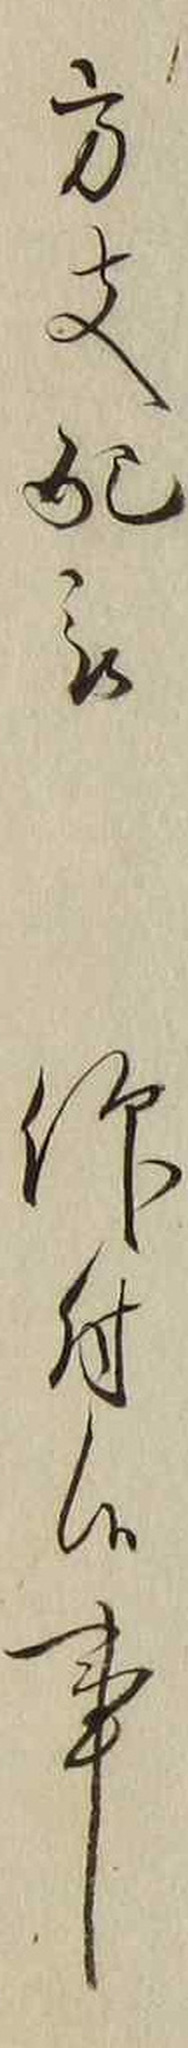方支配被仰付候事

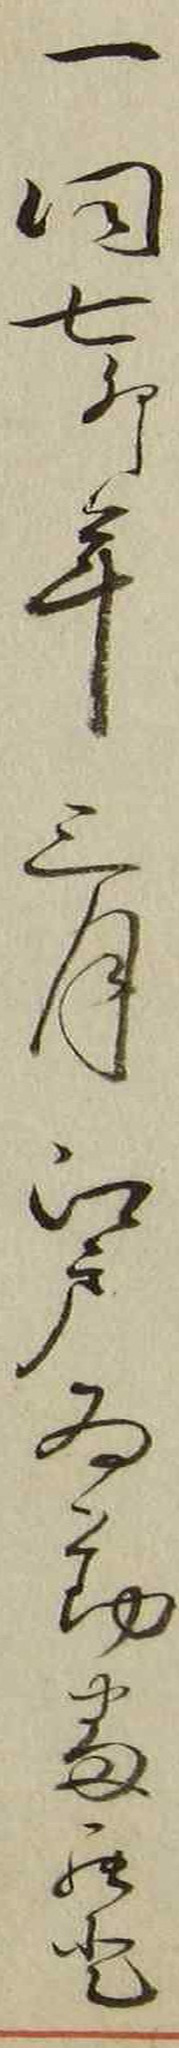一同七卯年三月江戸為勤番罷登
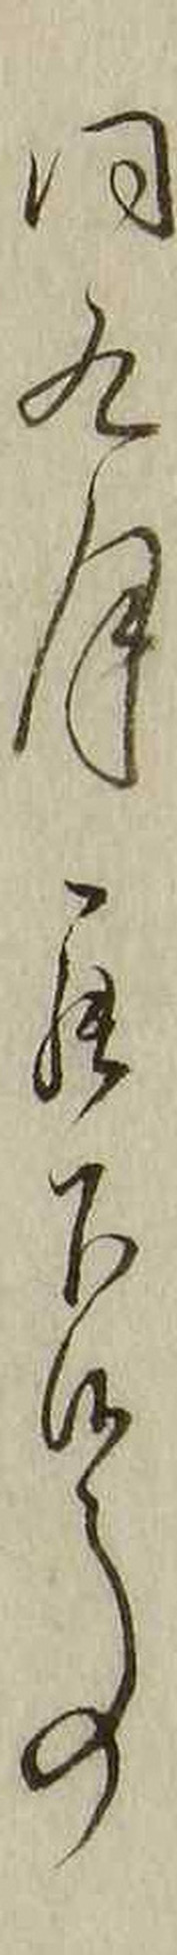同九月罷下候事
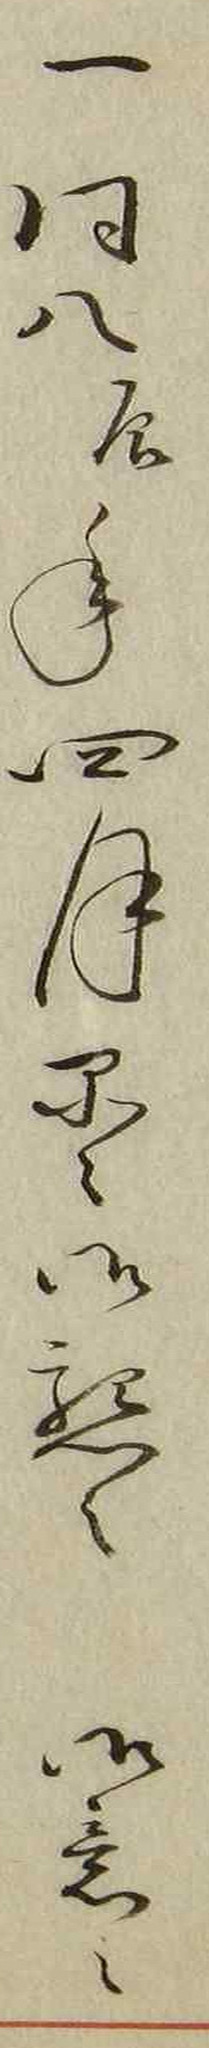一同八辰年四月品々御懇之御意之
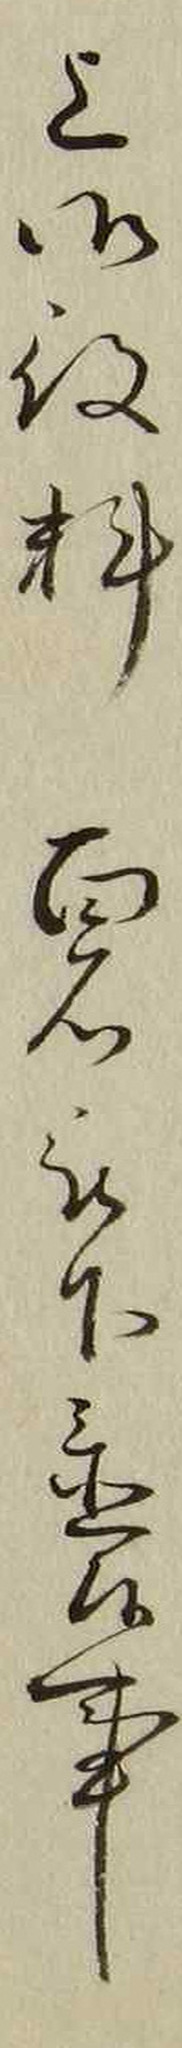上御役料百石被下置候事
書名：諸士系譜　巻之2　い之部2
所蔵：会津若松市立会津図書館
